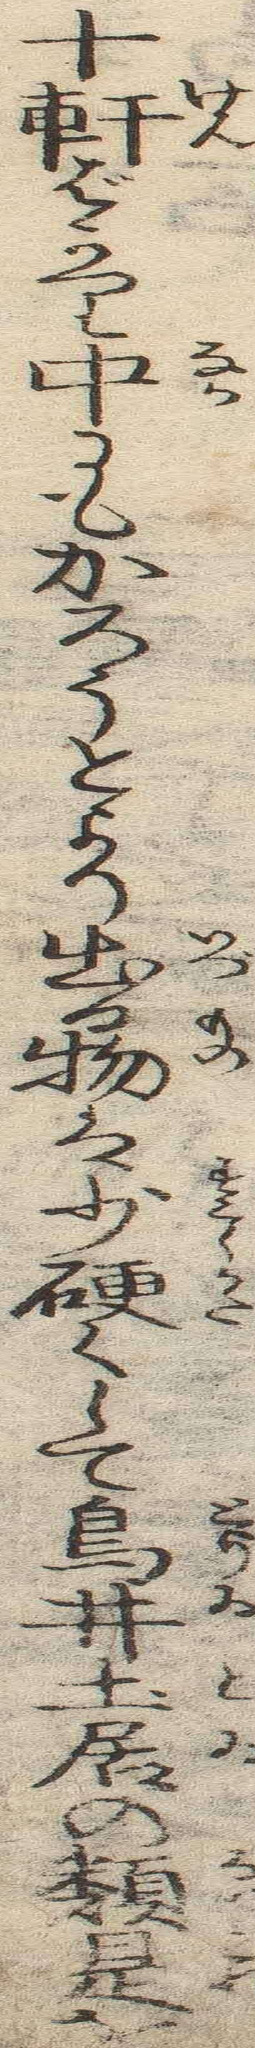十軒ばかり中にもかろうとより出る物は少硬くして鳥井土居の類是を
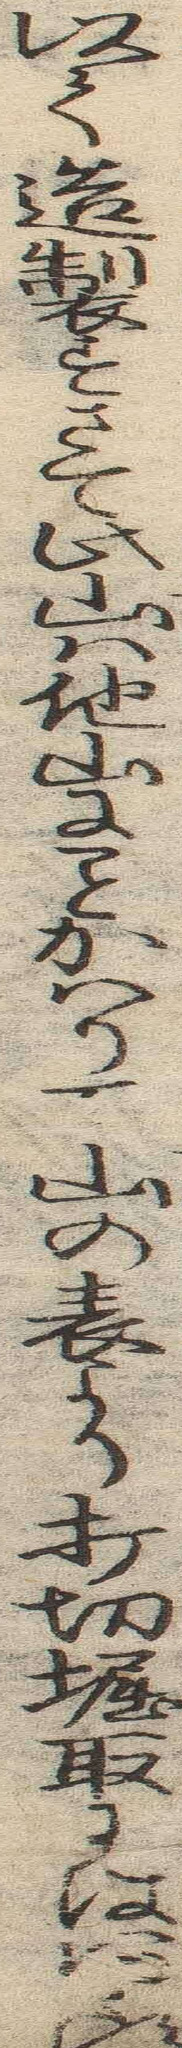以て造製すさて此山は他山にことかはり山の表より打切堀取にはあらず
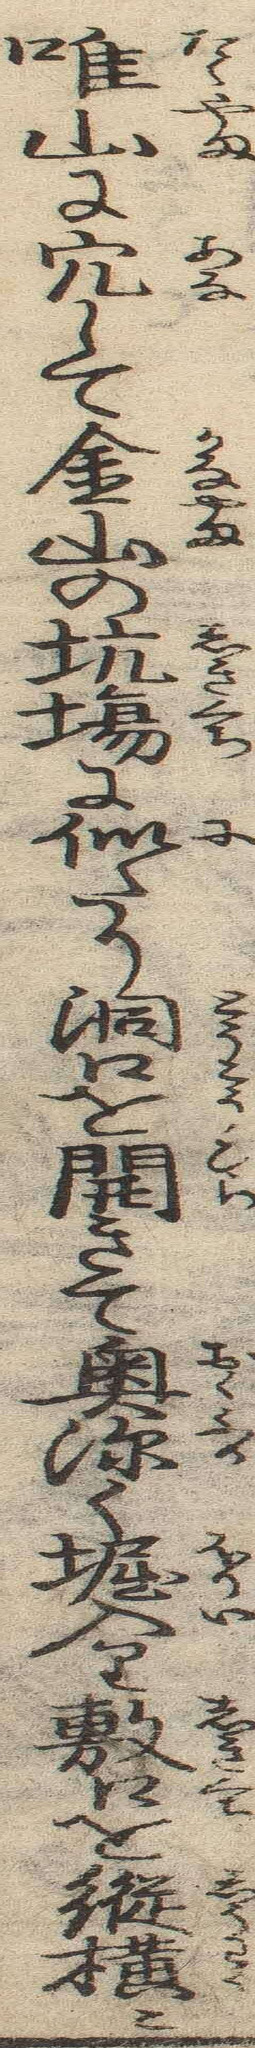唯山に穴して金山の坑場に似たり洞口を開きて奥深く堀入り敷口を縦横に

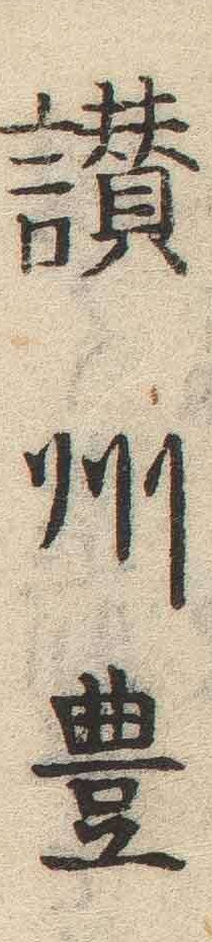讃州豊

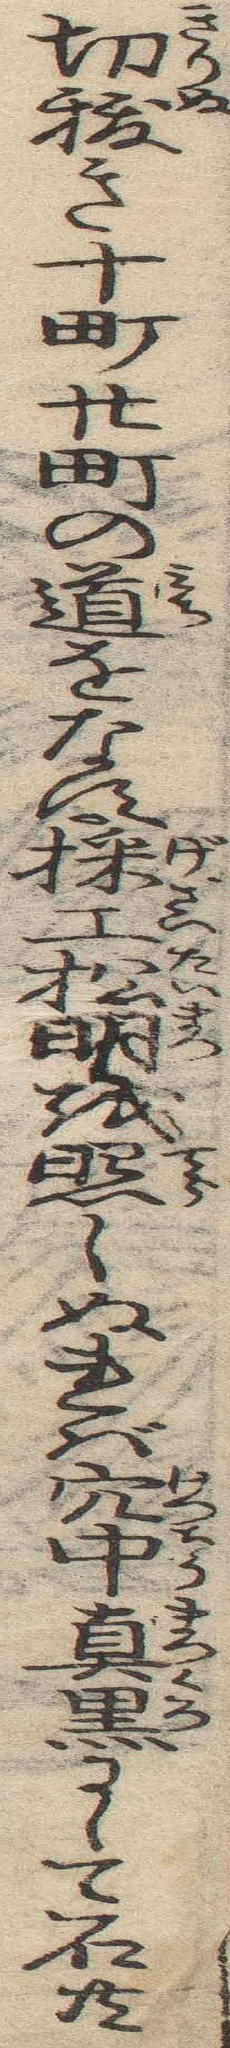切抜き十町廿町の道をなす。採工松明を照しぬれば穴中真黒にして石共
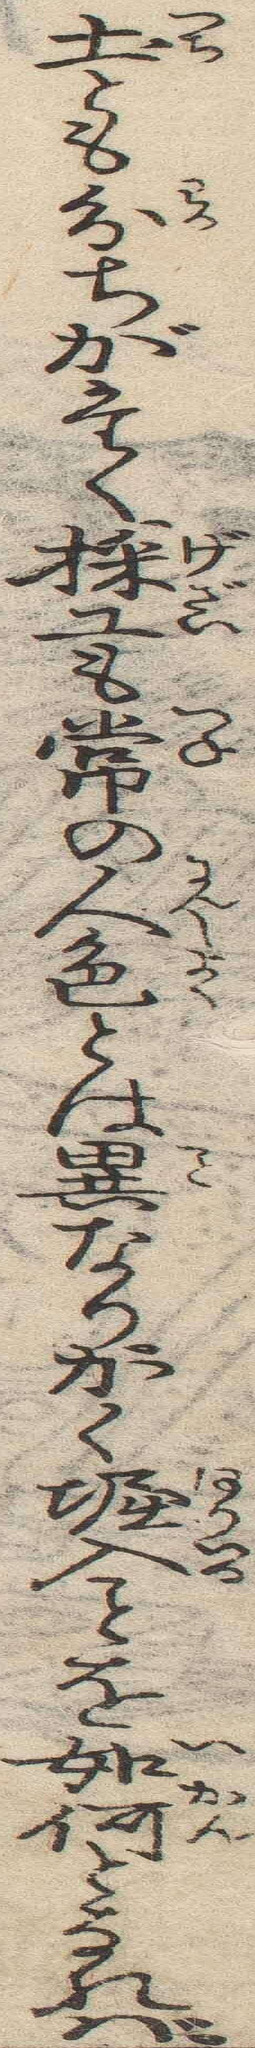土とも分ちがたく。採工も常の人色とは異なり。かく堀入ことを如何となれば。
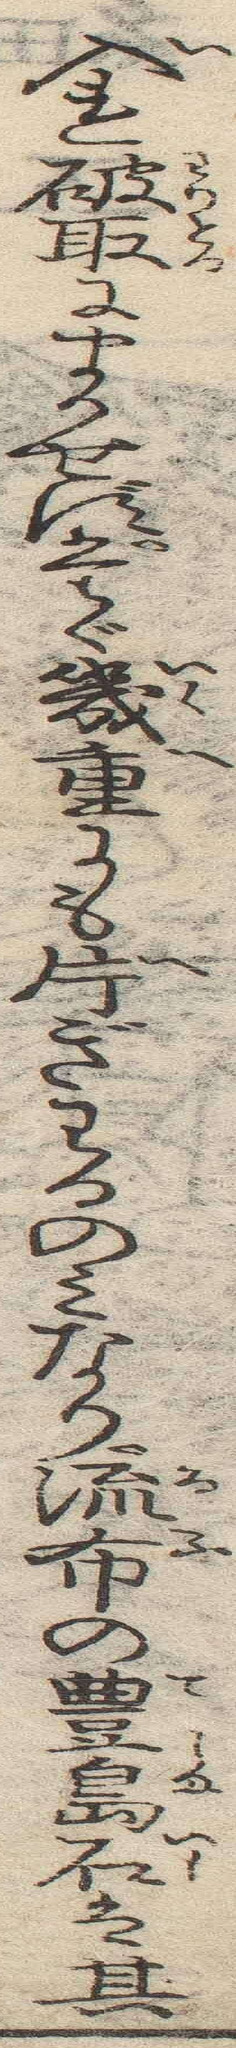入破取にまかせず。たゞ幾重にも片ぎわるのみなり。流布の豊島石は其
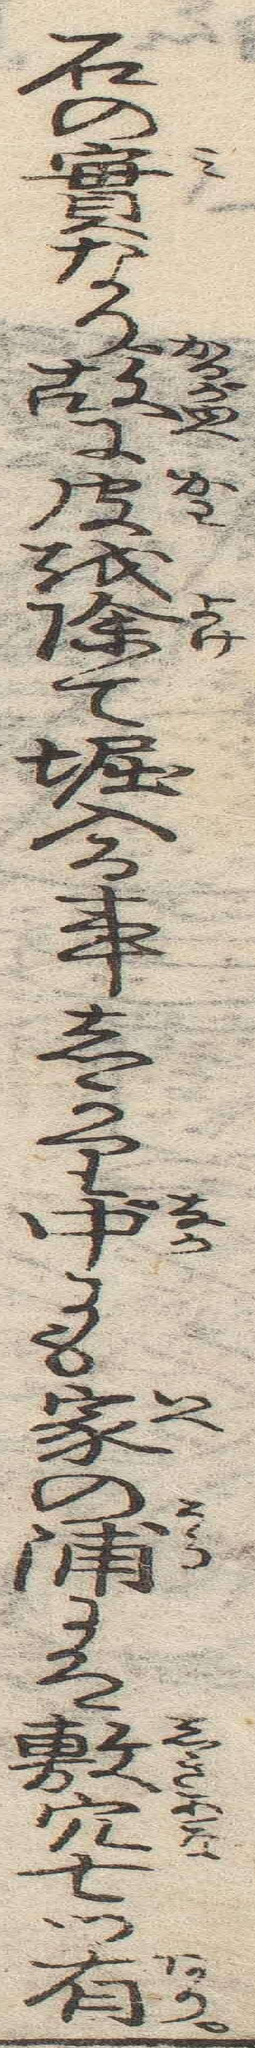石の実なり。故に皮を除て堀入る事しかり。中にも家の浦には敷穴七ツ有。
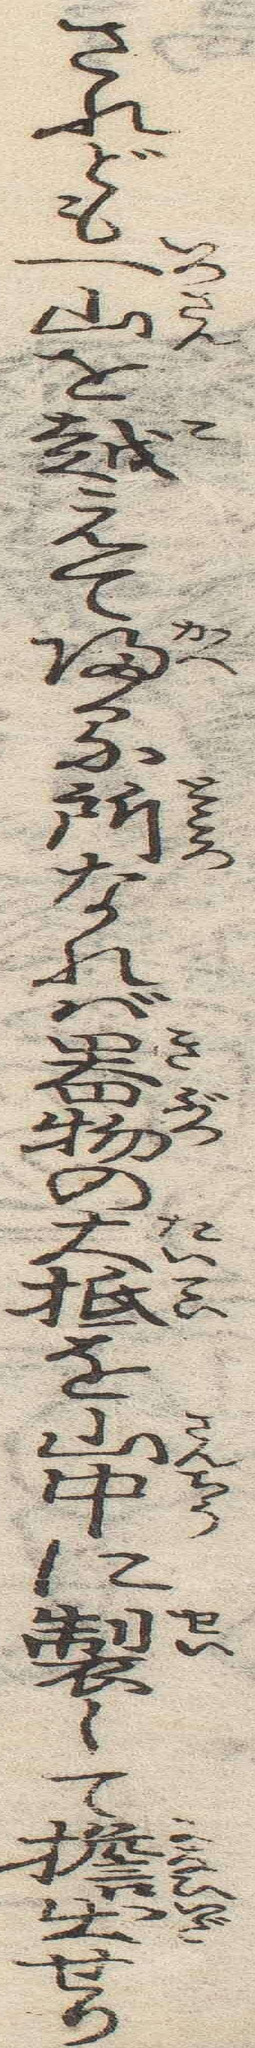されども一山を越えて帰る所なれば器物の大抵を山中に製して担出せり
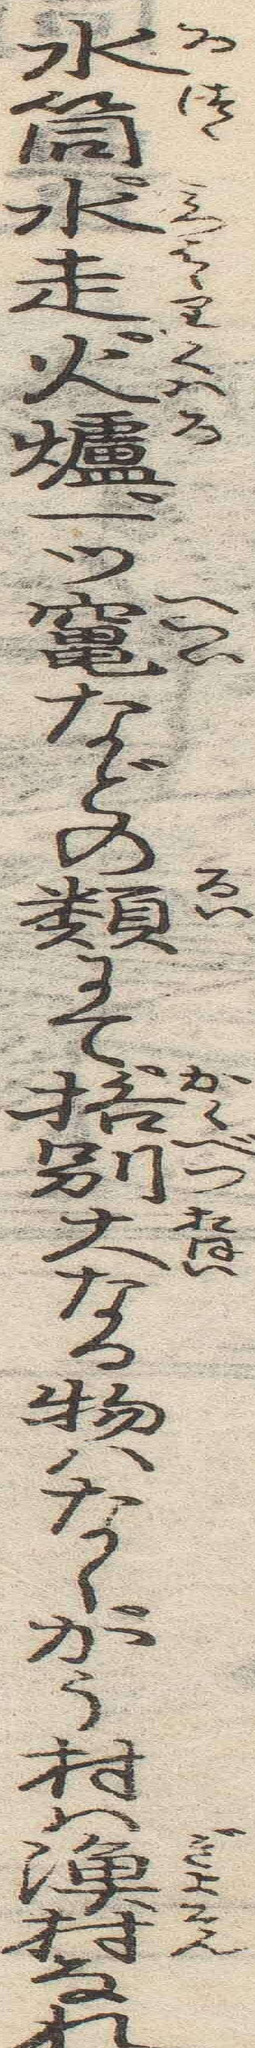水筒。水走。火爐。一ツ竃などの類にて。格別大なる物はなし。かう村は漁村なれ
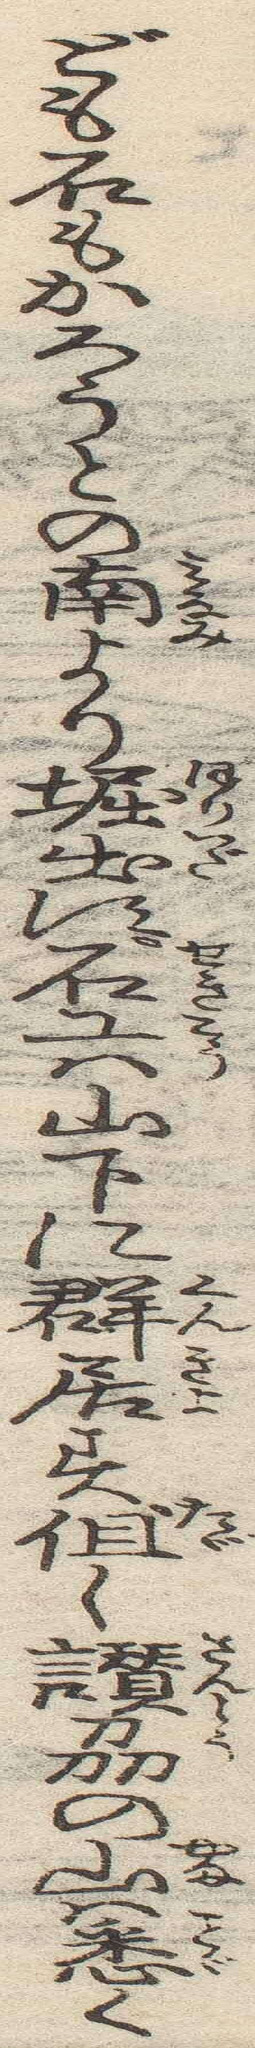ども石もかろうとの南より堀出す。石工は山下に群居す。但し讃州の山は悉く
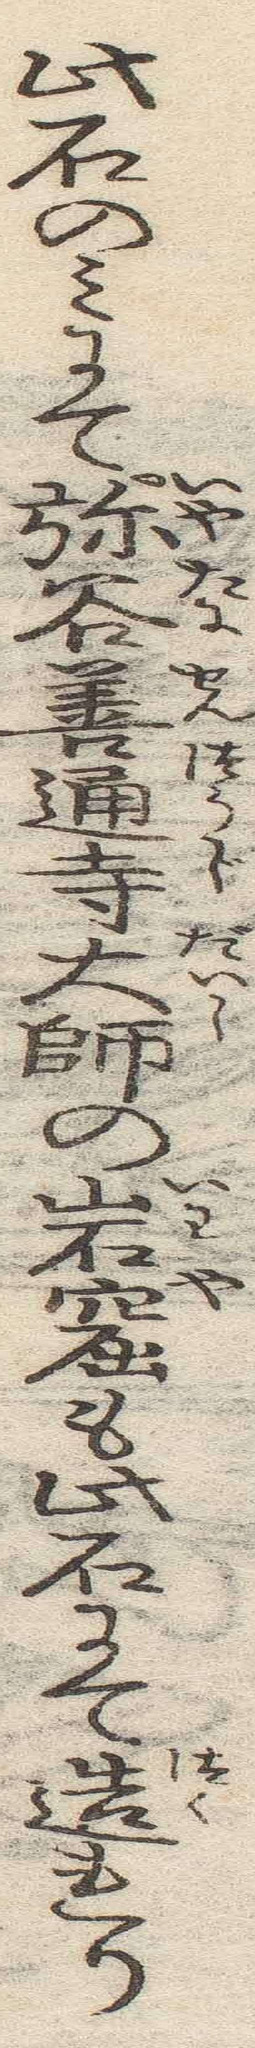此石のみにて。弥谷善通寺大師の岩窟も此石にて造れり
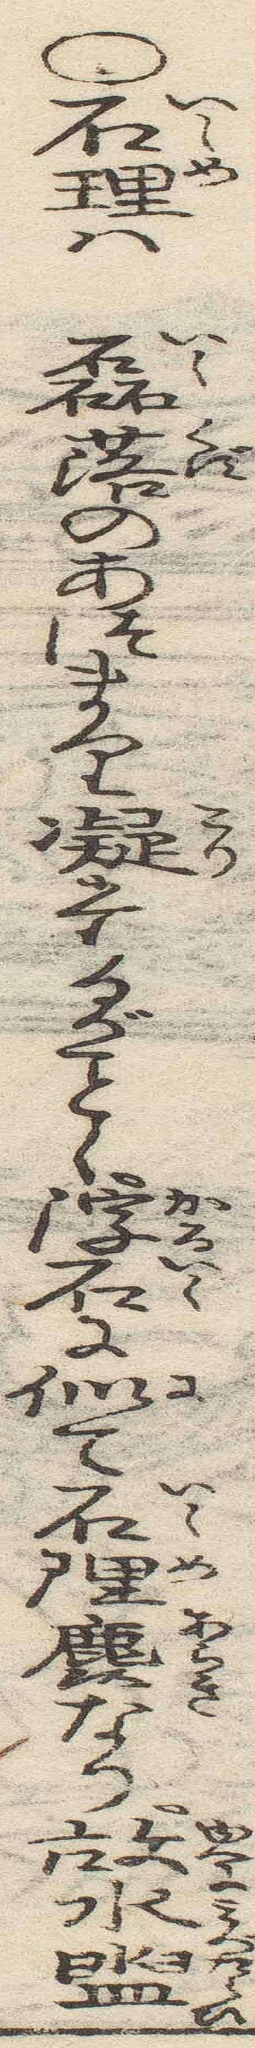○石理は磊落のあつまり凝たるがごとし。浮石に似て石理麤なり。故水盥
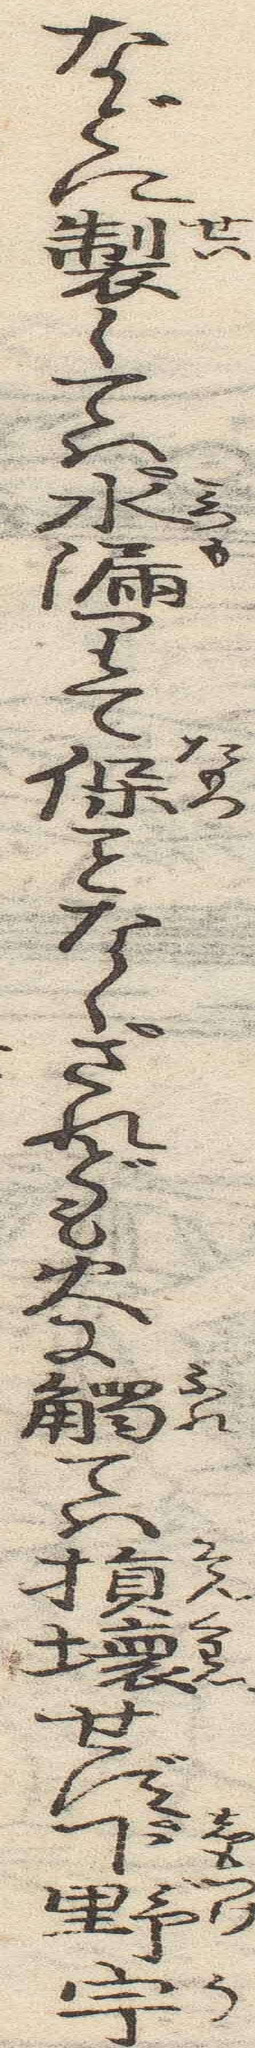などに製しては。水漏りて保ことなし。されども火に触ては損壊せず。下野宇
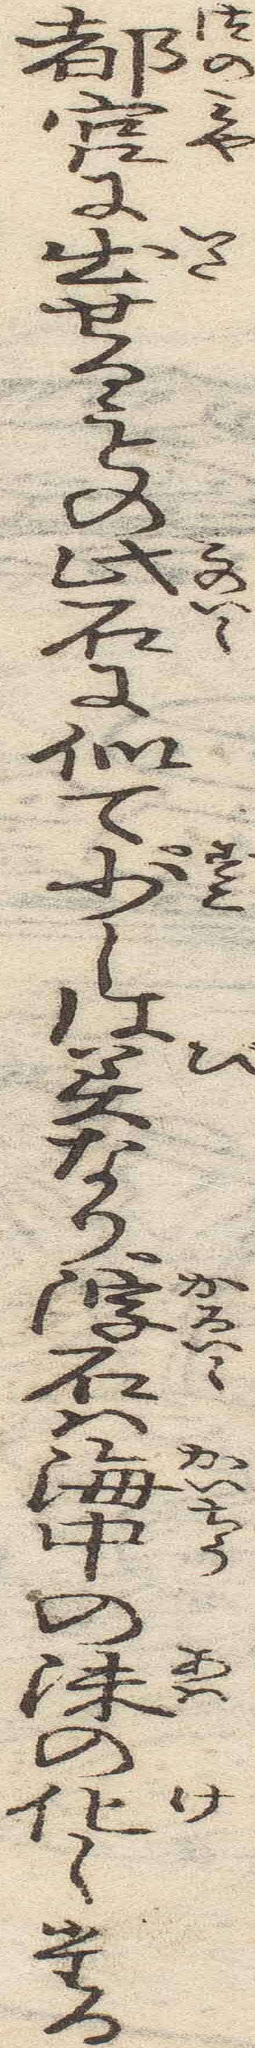都宮に出せるもの此石に似て。少しは美なり。浮石は海中の沫の化したる
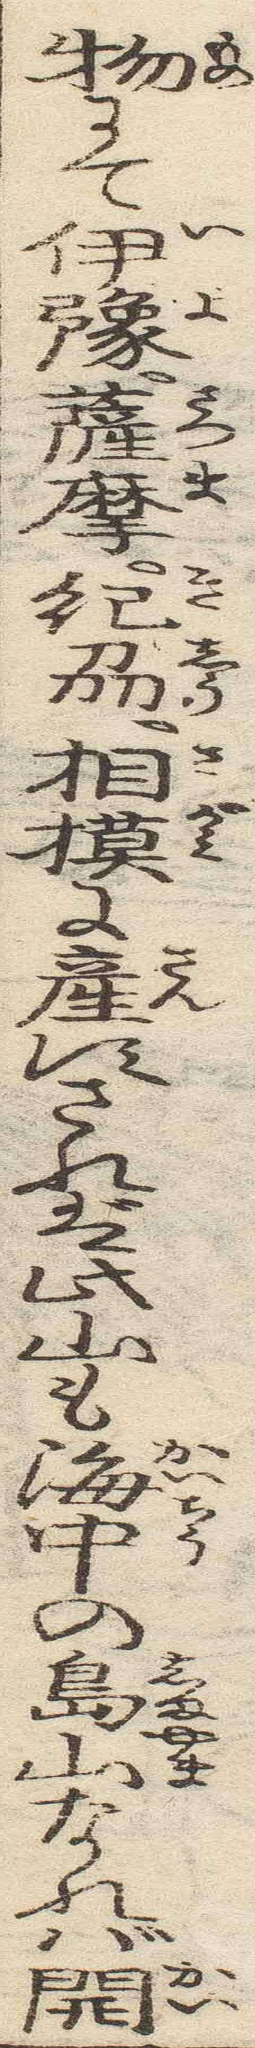物にて伊予。薩摩。紀州。相模に産すされば此山も海中の島山なれば開
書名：日本山海名産図会
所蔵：東京学芸大学附属図書館 国文学研究資料館
